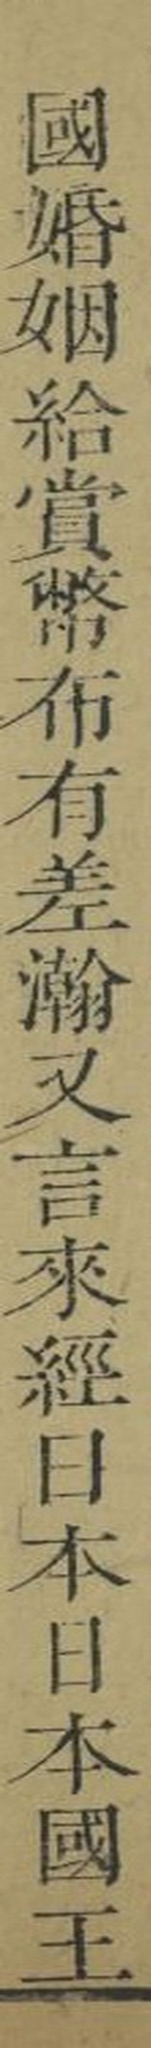国婚姻給賞幣布有差瀚又言来経日本日本国王
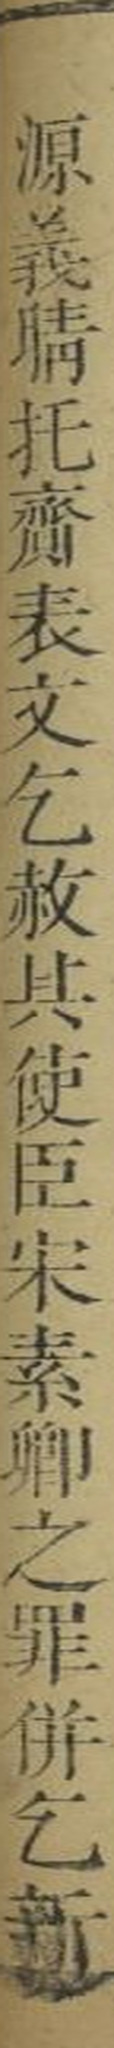源義晴托齎表文乞赦其使臣宋素卿之罪併乞新
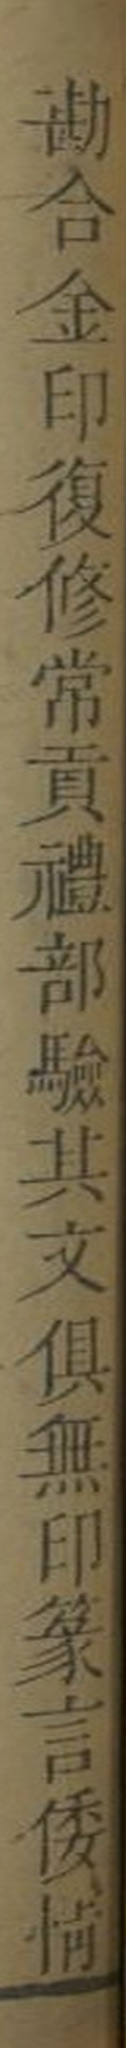勘合金印復修常貢礼部験其文俱無印篆言倭情
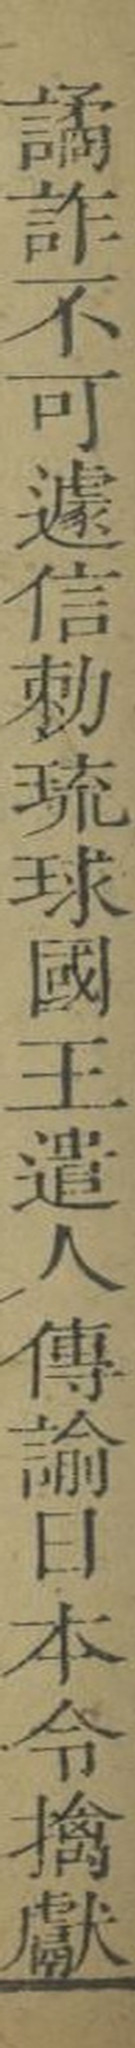譎詐不可遽信勅琉球国王遣人伝諭日本令擒献
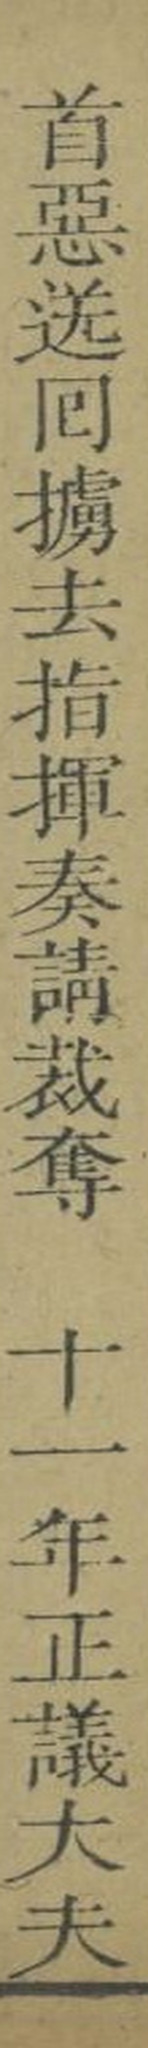首悪送回擄去指揮奏請裁奪十一年正議大夫
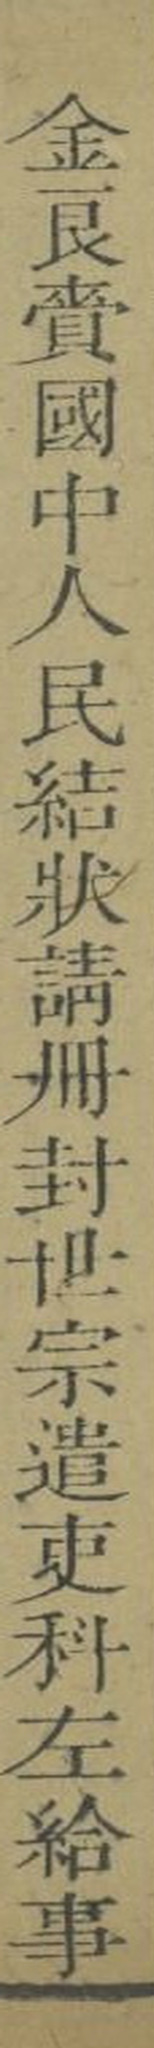金良賚国中人民結状請冊封世宗遣吏科左給事
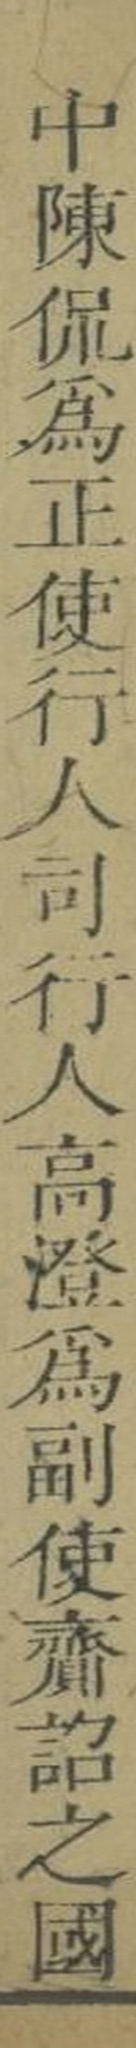中陳侃為正使行人司行人高澄為副使齎詔之国
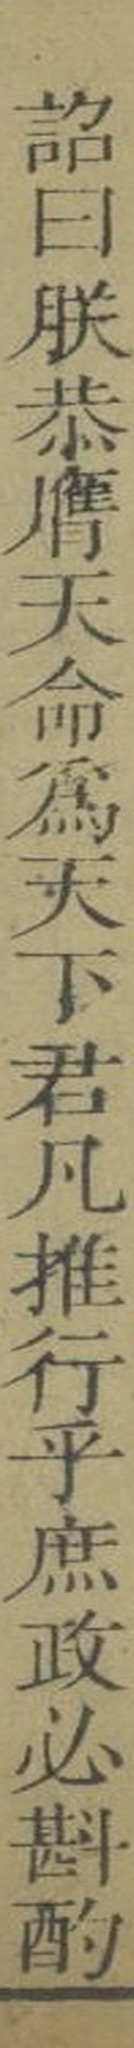詔曰朕恭膺天命為天下君凡推行乎庶政必斟酌
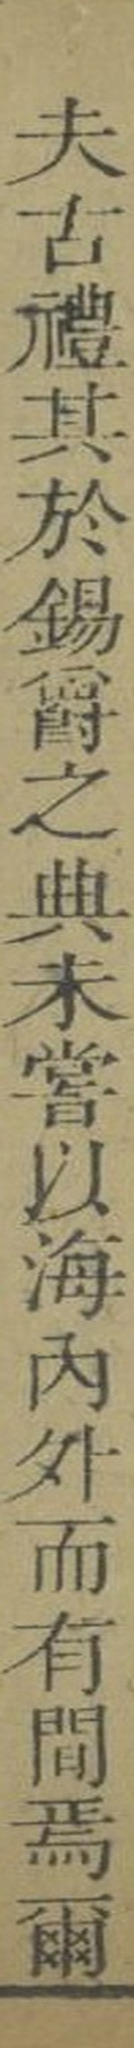夫古礼其於錫爵之典未嘗以海内外而有間焉爾
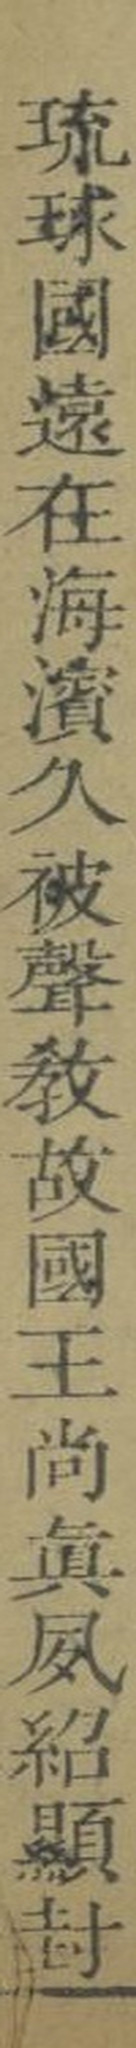琉球国遠在海浜久被声教故国王尚真夙紹顕封
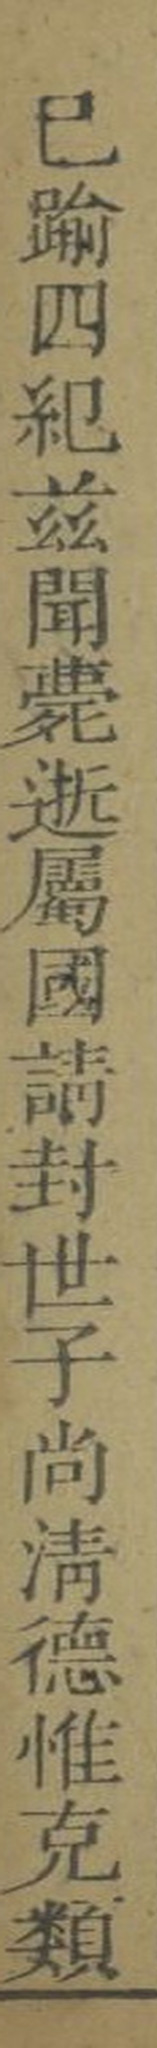巳踰四紀茲聞薨逝属国請封世子尚清徳惟克類

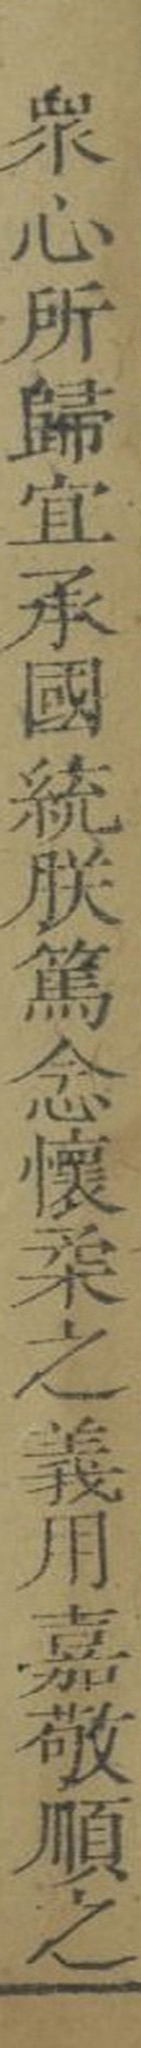衆心所帰宜承国統朕篤念懐柔之義用嘉敬順之
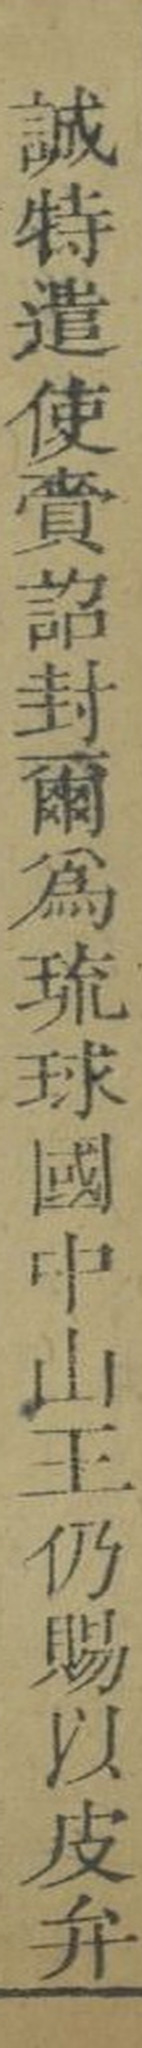誠特遣使賚詔封爾為琉球国中山王仍賜以皮弁
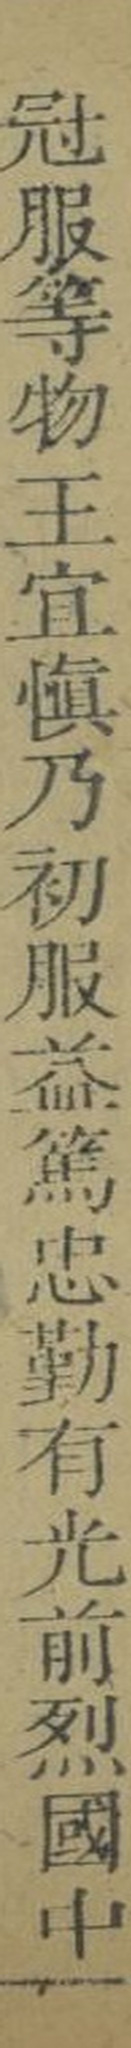冠服等物王宜慎乃初服益篤忠勤有光前烈国中
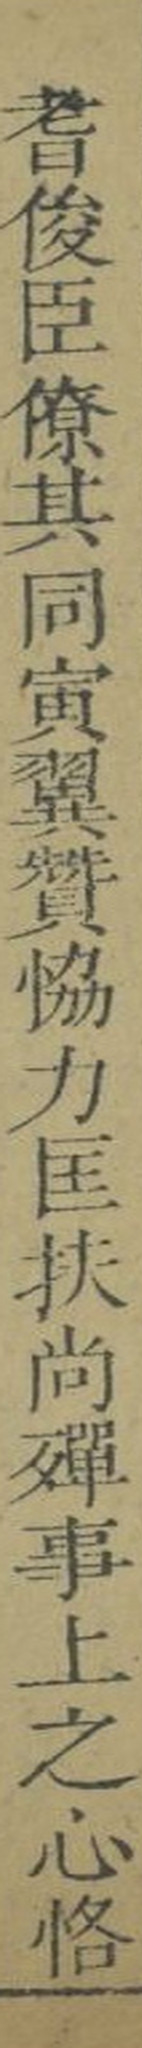耆俊臣僚其同寅翼賛恊力匡扶尚殫事上之心恪
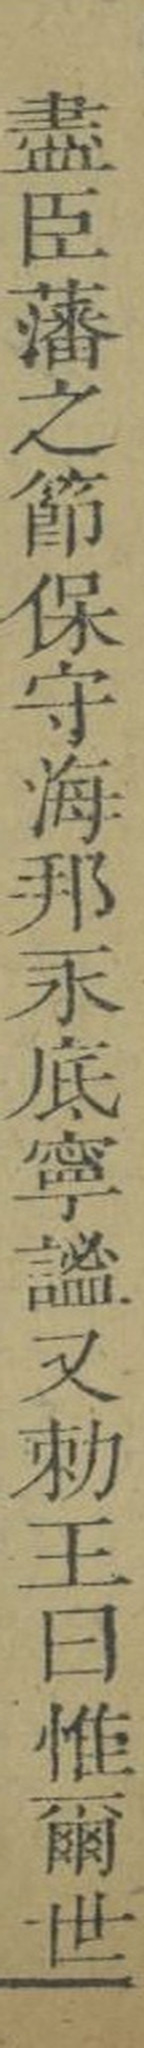尽臣藩之節保守海邦永底寧謐又勅王曰惟爾世
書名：中山伝信録 巻三
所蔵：University of the Ryukyus Library
